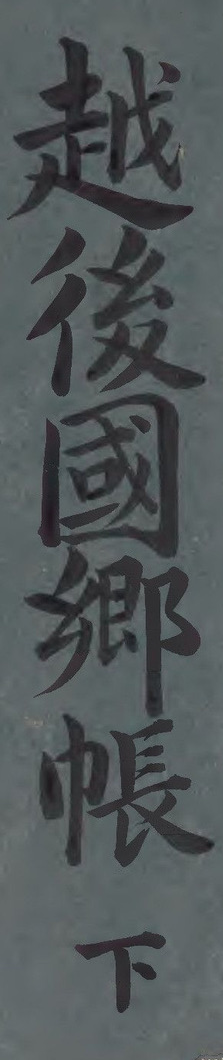越後国郷帳下

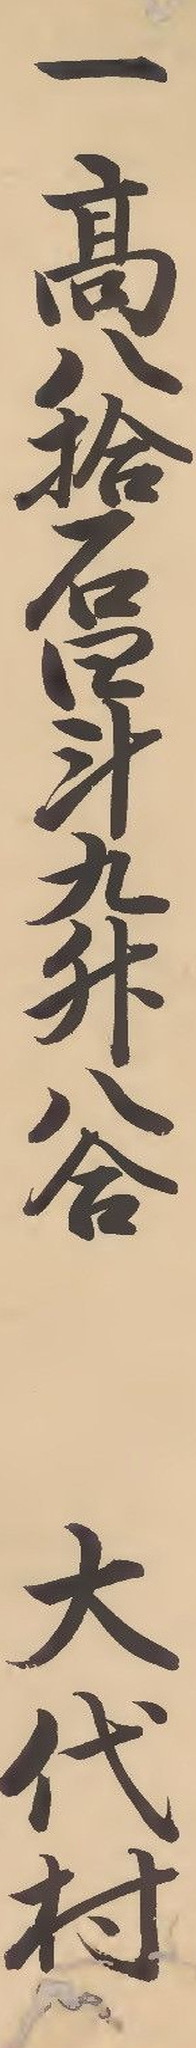一高八拾石四斗九升八合大代村

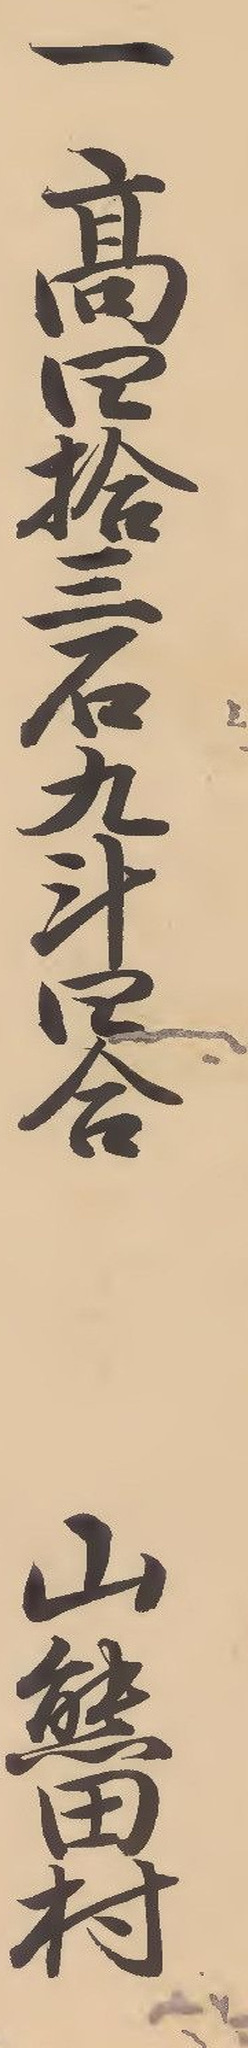一高四拾三石九斗四合山熊田村
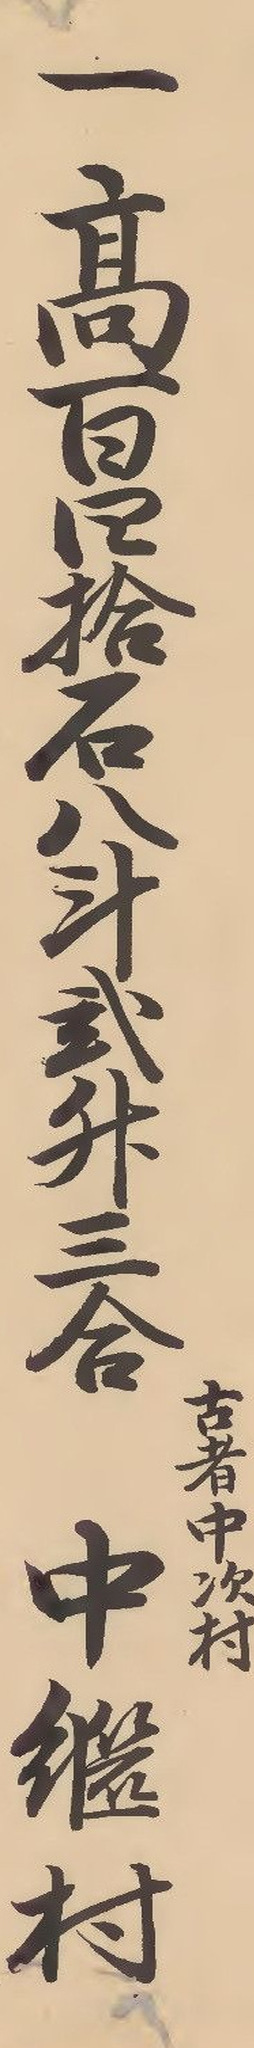一高百四拾石八斗弐升三合中継村
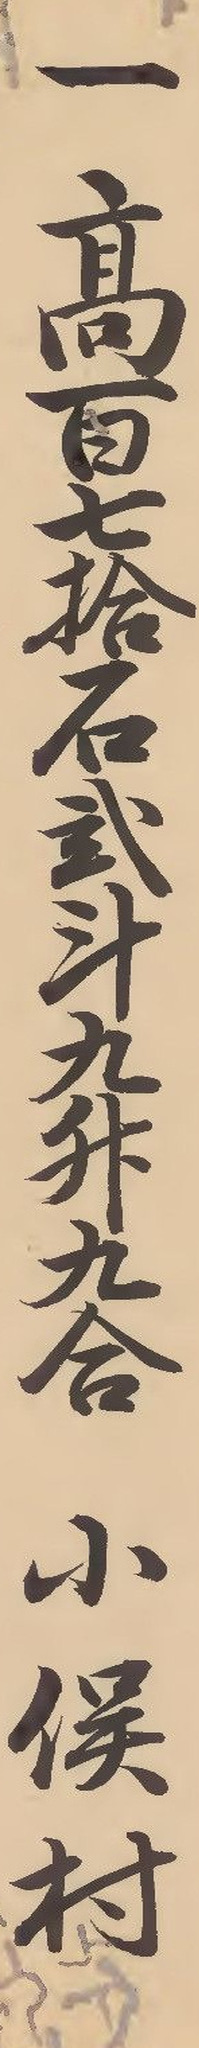一高百七拾石弐斗九升九合小俣村
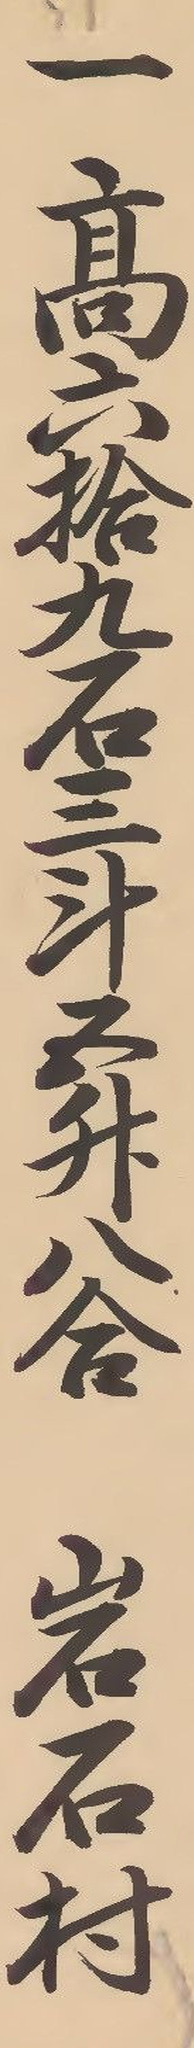一高六拾九石三斗五升八合岩石村
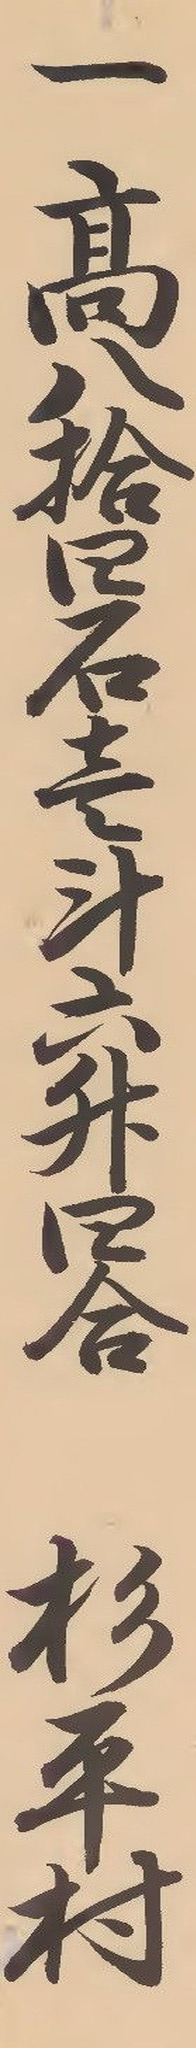一高八拾四石壱斗六升四合杉平村
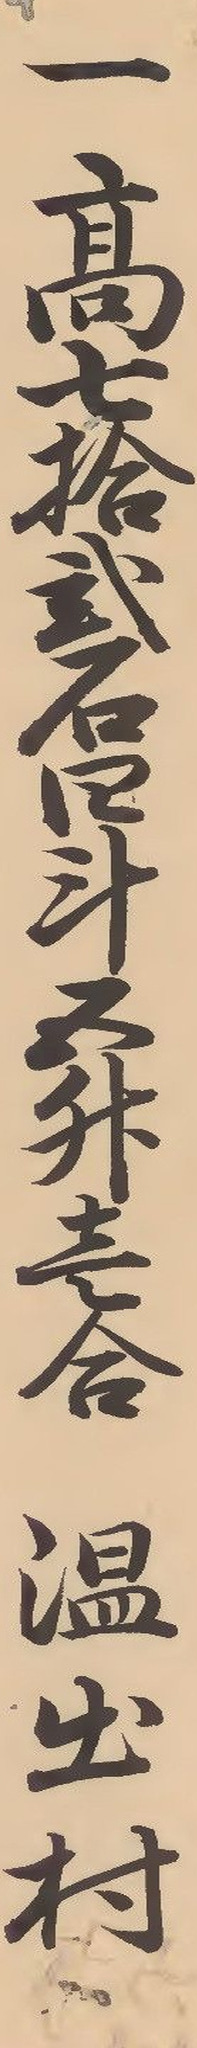一高七拾弐石四斗五升壱合温出村
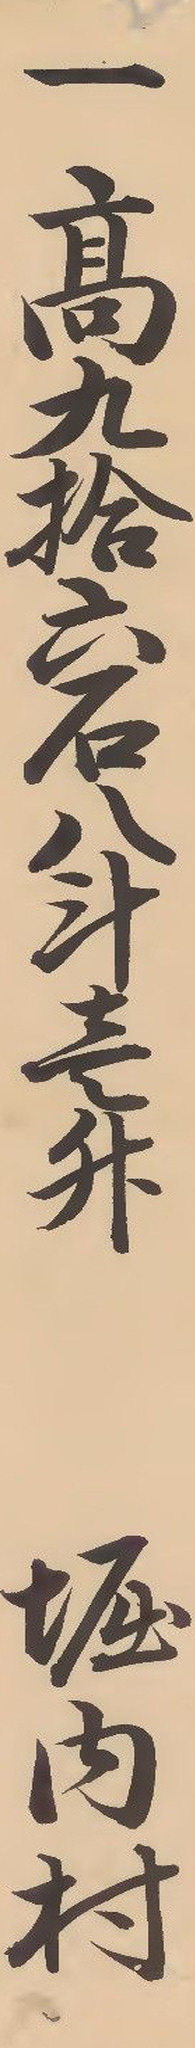一高九拾六石八斗壱升堀内村
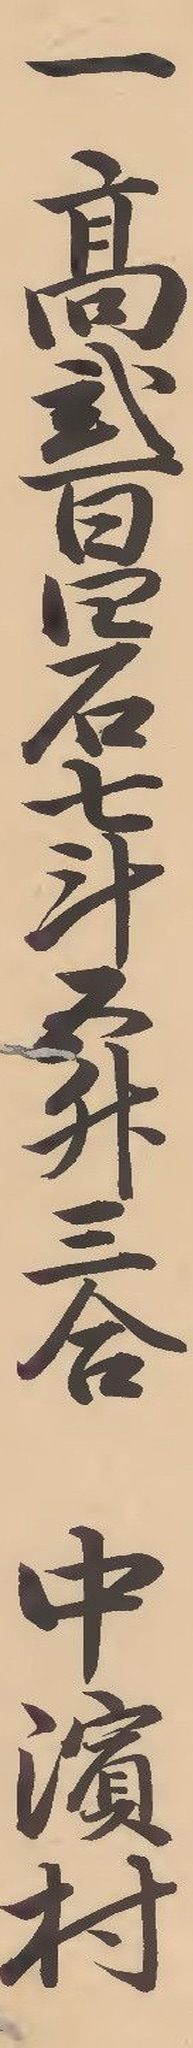一高弐百四石七斗五升三合中浜村

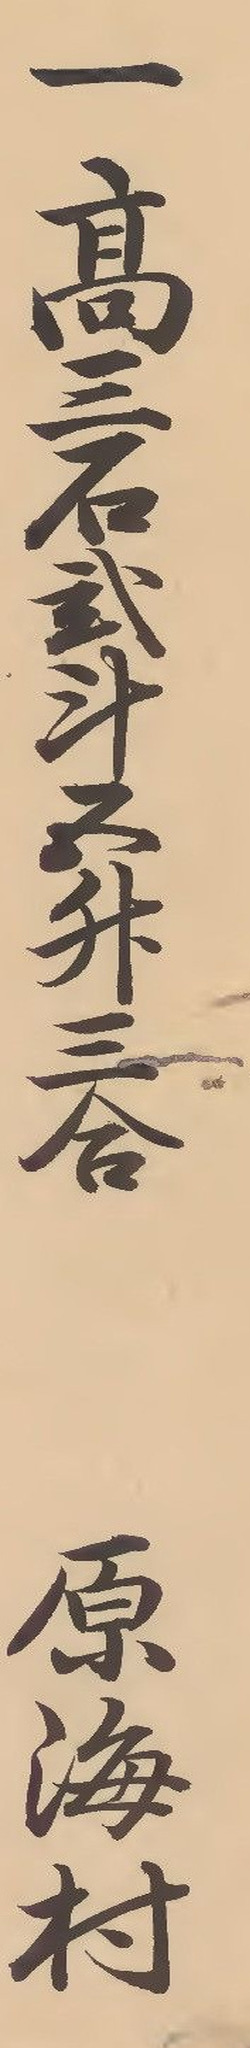一高三石弐斗五升三合原海村
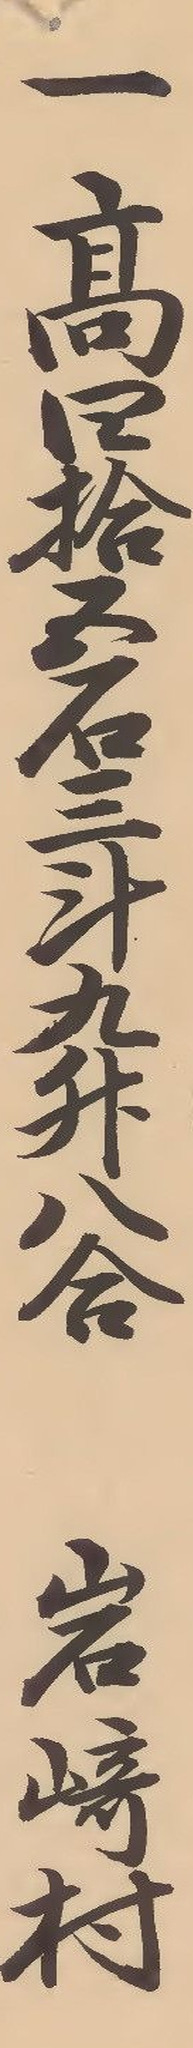一高四拾五石三斗九升八合岩崎村
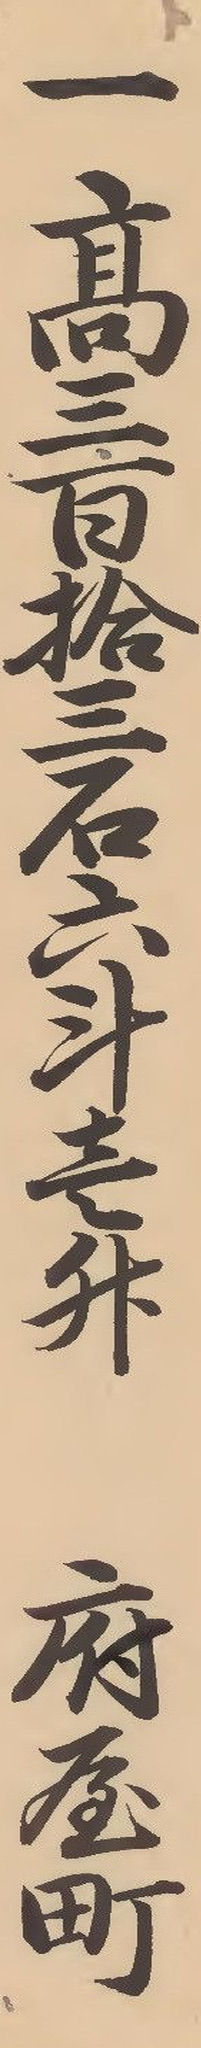一高三百拾三石六斗壱升府屋町
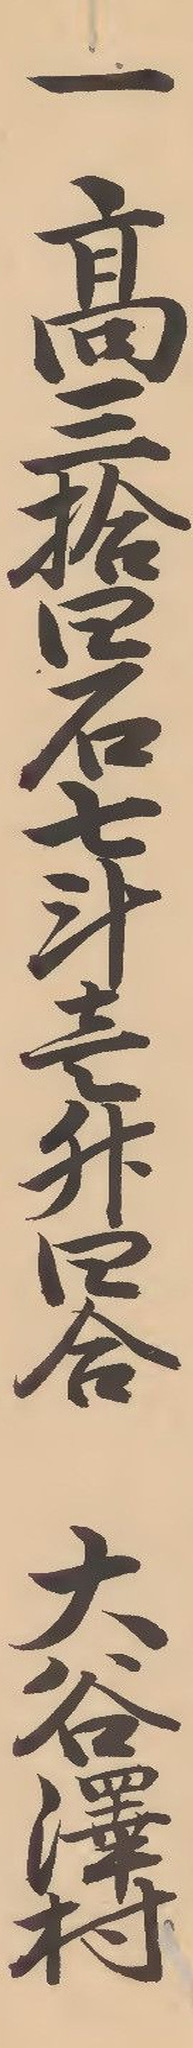一高三拾四石七斗壱升四合大谷沢村
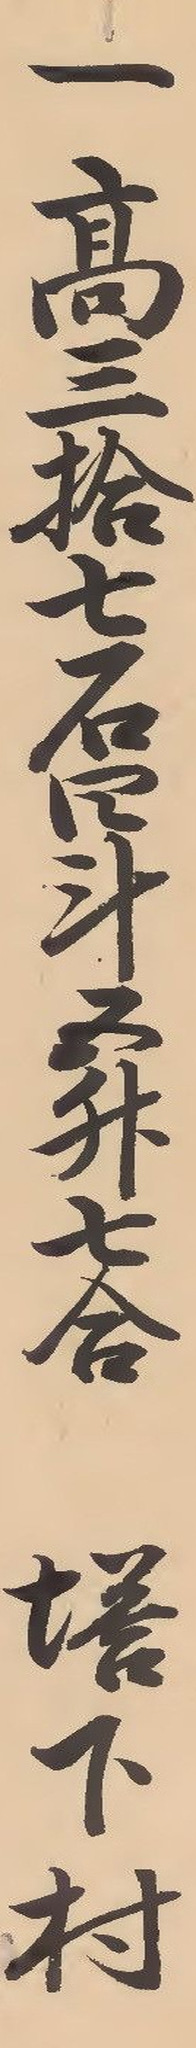一高三拾七石四斗五升七合塔下村
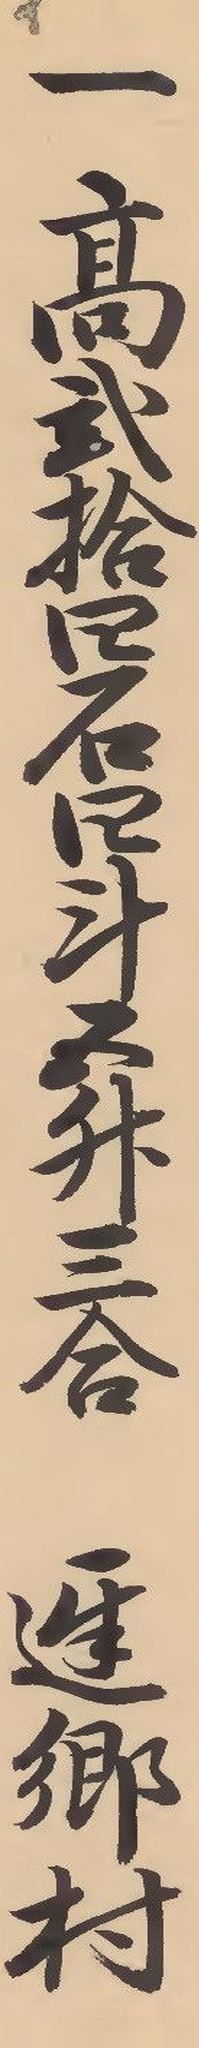一高弐拾四石四斗五升三合遅郷村
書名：越後国郷帳　下
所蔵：国立公文書館 National Archives of Japan
